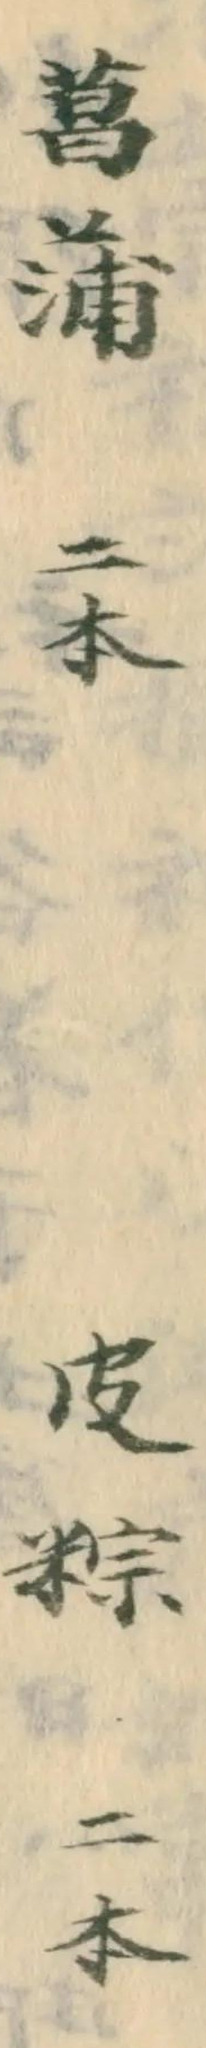菖蒲二本皮粽二本
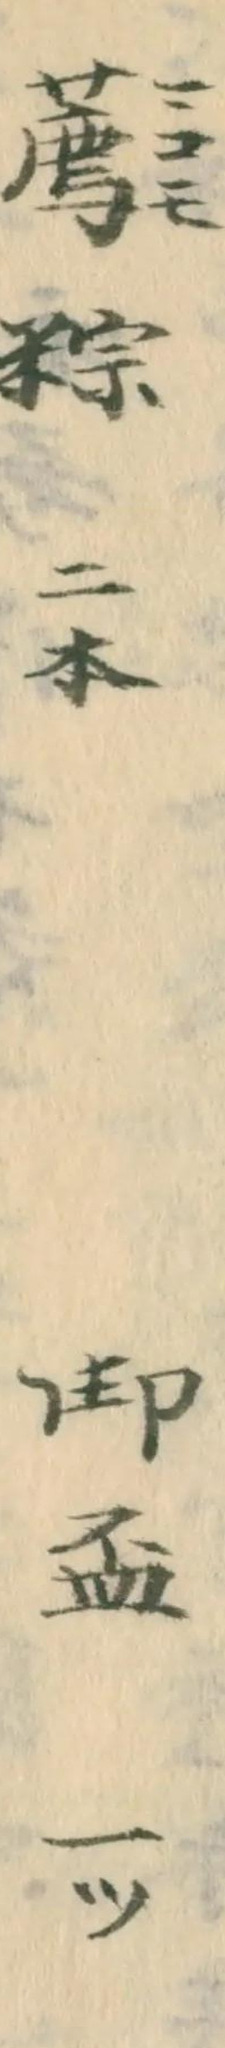薦粽二本御盃一ツ
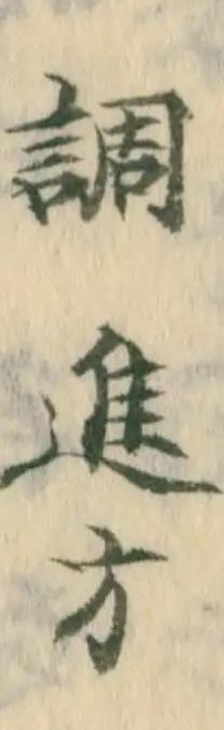調進方
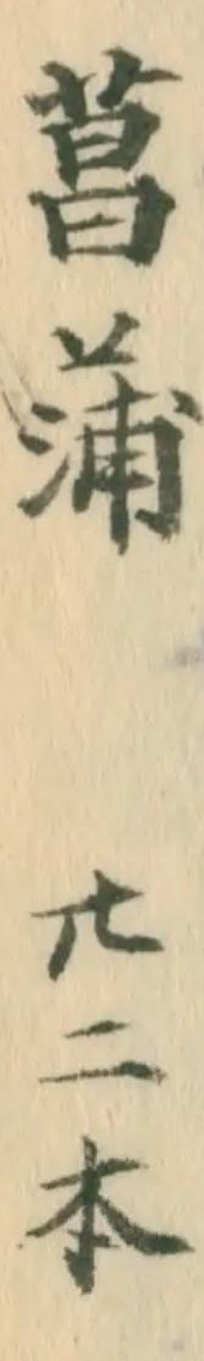菖蒲廿二本

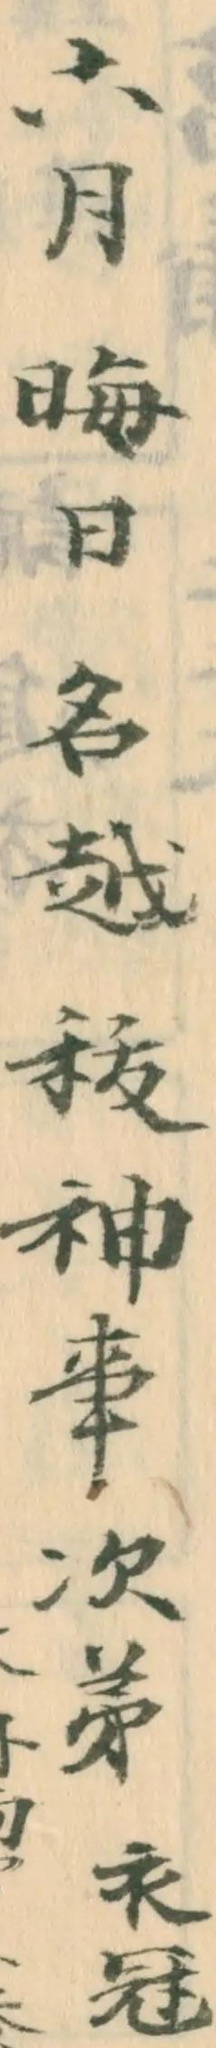六月晦日名越祓神事次第衣冠
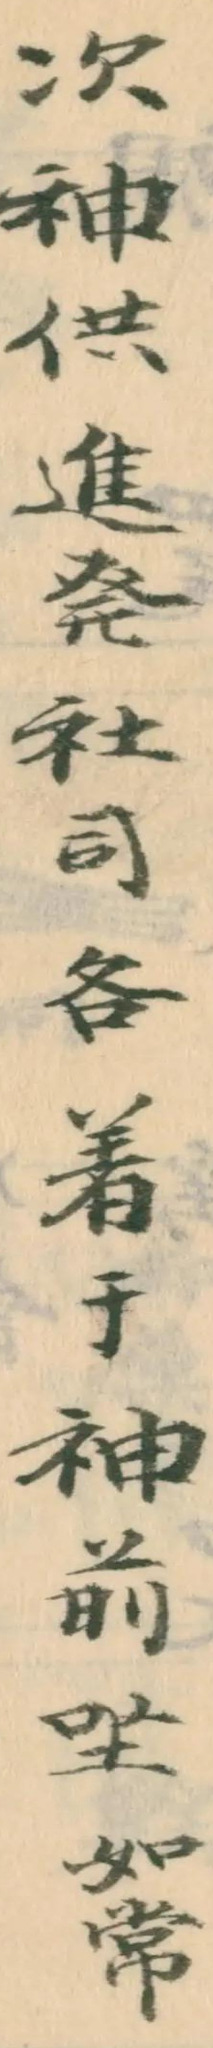次神供進発社司各着于神前坐如常
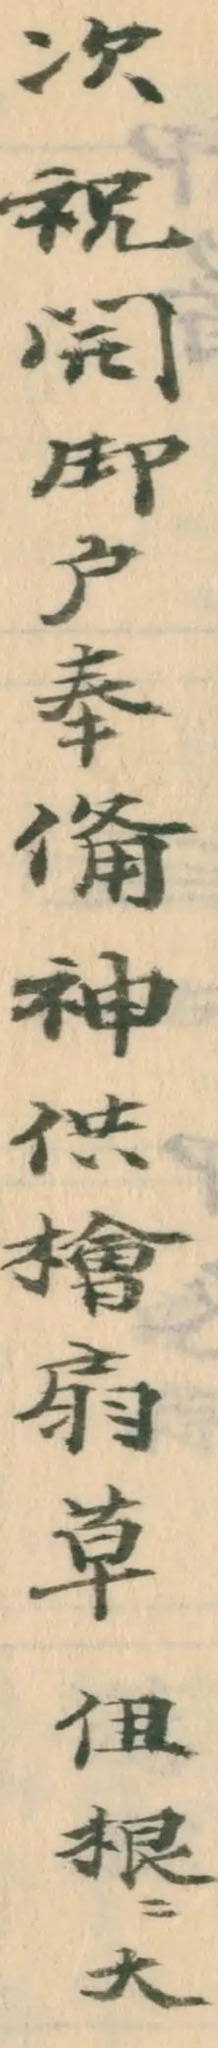次祝開御戸奉備神供檜扇草但根ニ大
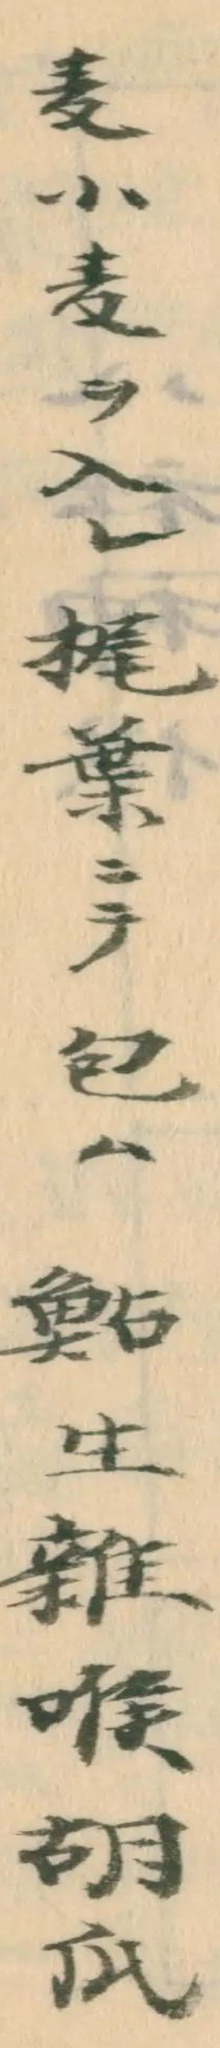麦小麦ヲ入レ梶葉ニテ包ム鮎生雑喉胡瓜
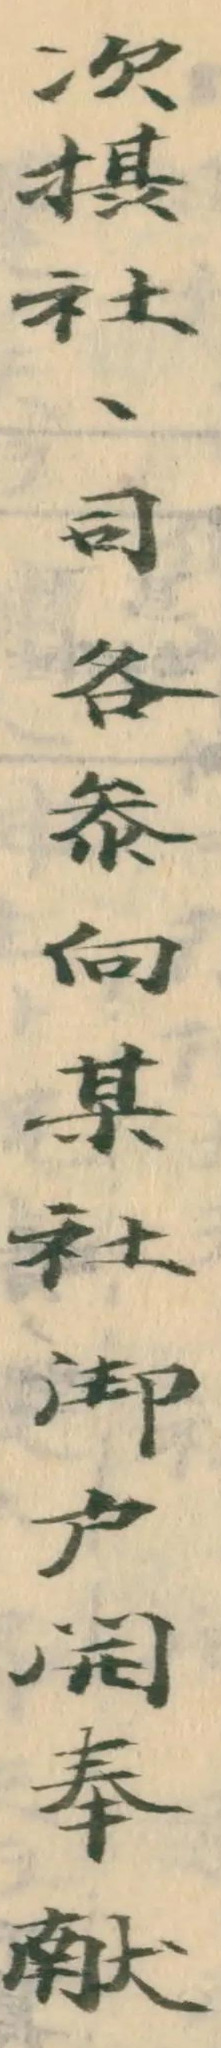次摂社へ司各参向某社御戸開奉献
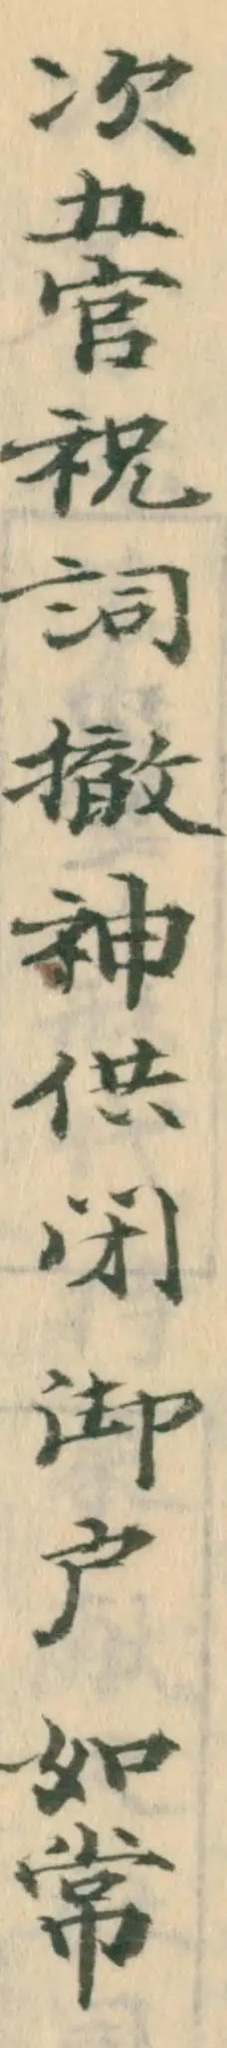次五宮祝詞撤神供閉御戸如常
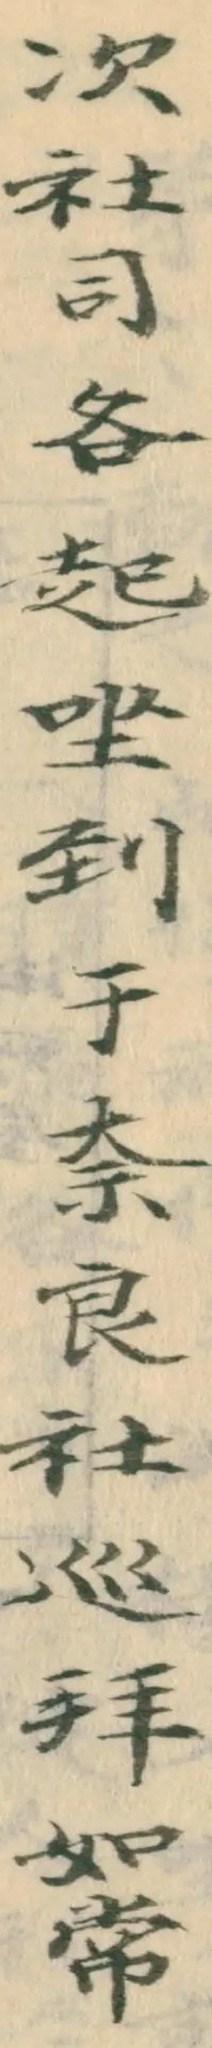次社司各起坐到于奈良社巡拝如常
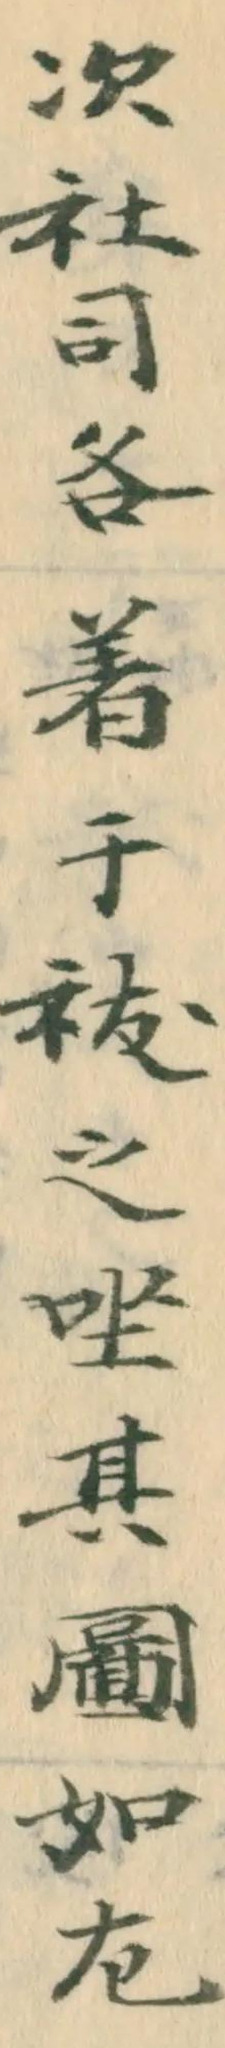次社司各着于祓之坐其図如左

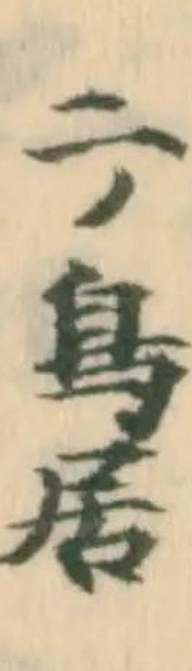二ノ鳥居
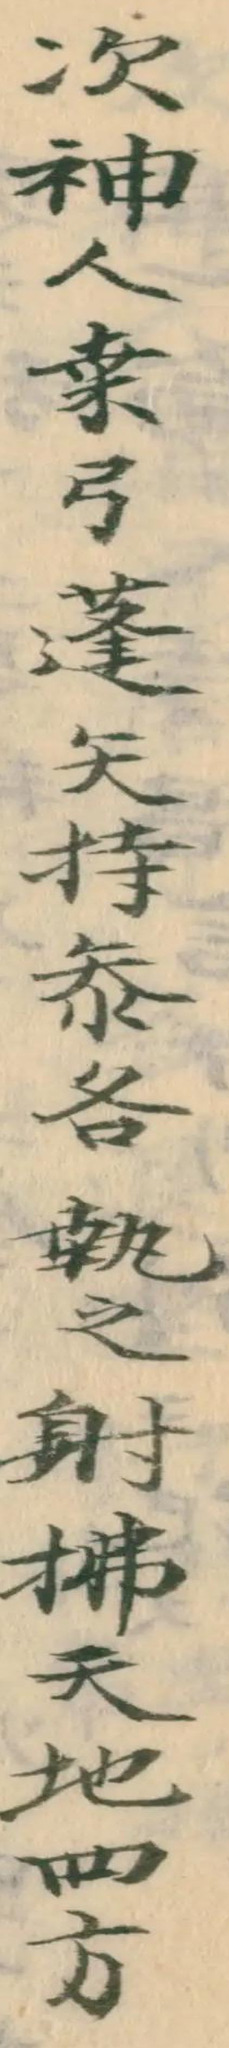次神人乗弓蓬矢持参各執之射払天地四方
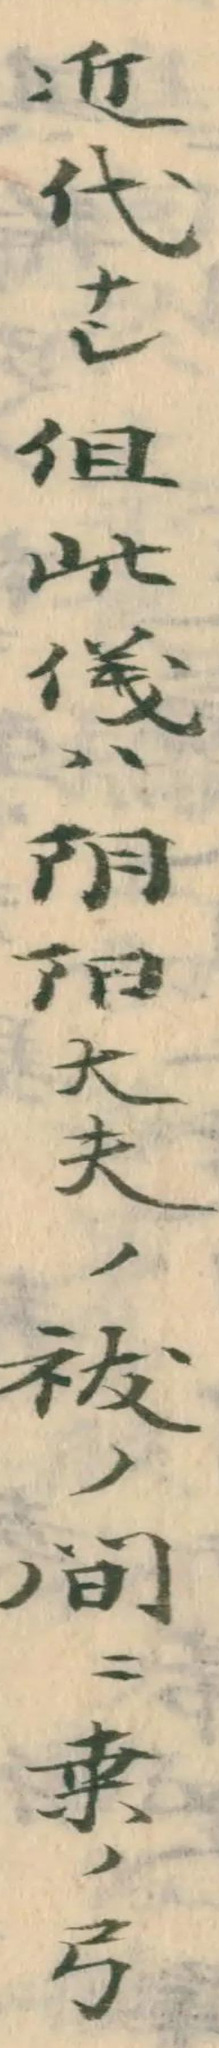近代ナシ但此儀ハ陰陽大夫ノ祓ノ間ニ乗ノ弓
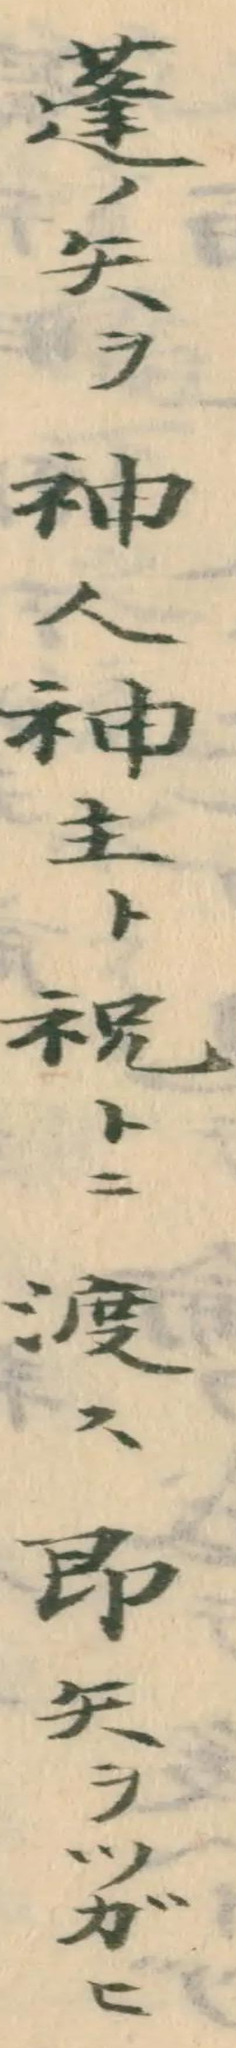蓬ノ矢ヲ神人神主ト祝トニ渡ス即矢ヲツガヒ
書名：賀茂社記録. 第5冊
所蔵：国立国会図書館 National Diet Library, JAPAN
